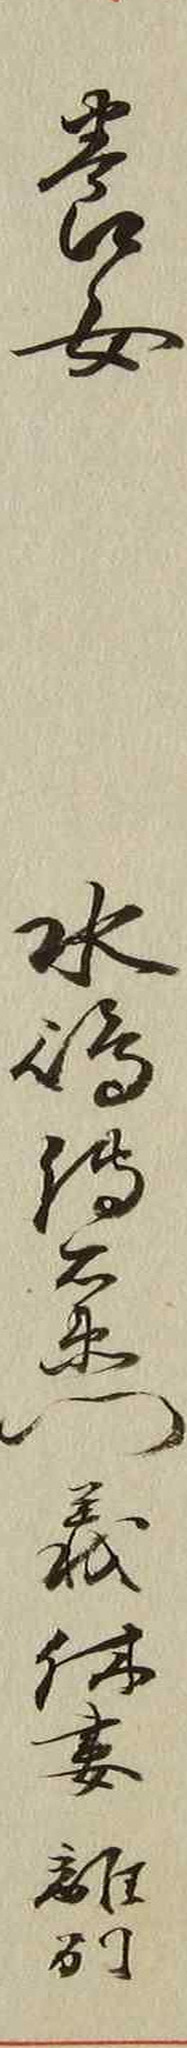養女水嶋伝右衛門義休妻離別
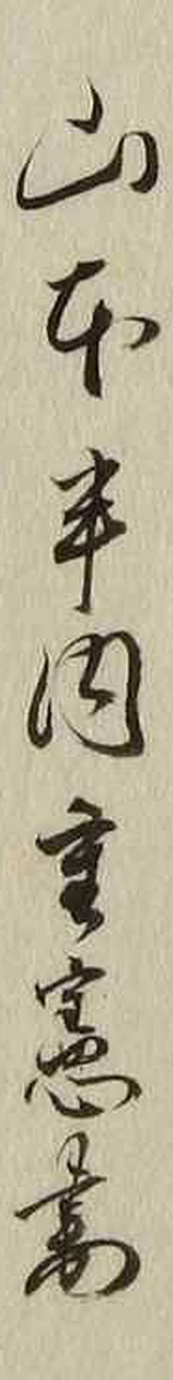山本半内重憲妻
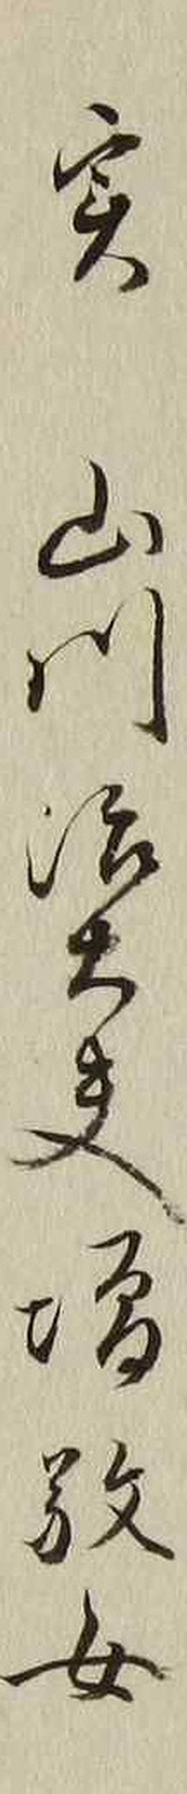実山川治大夫増敬女
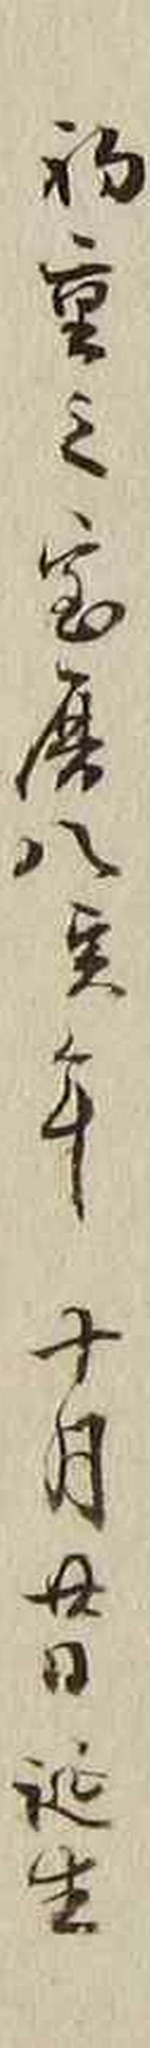初重之宝暦八寅年十月廿日誕生
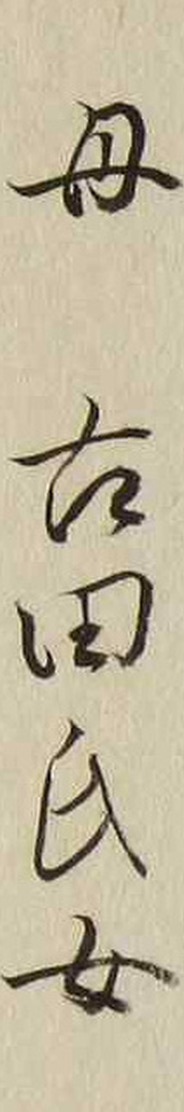母古田氏女

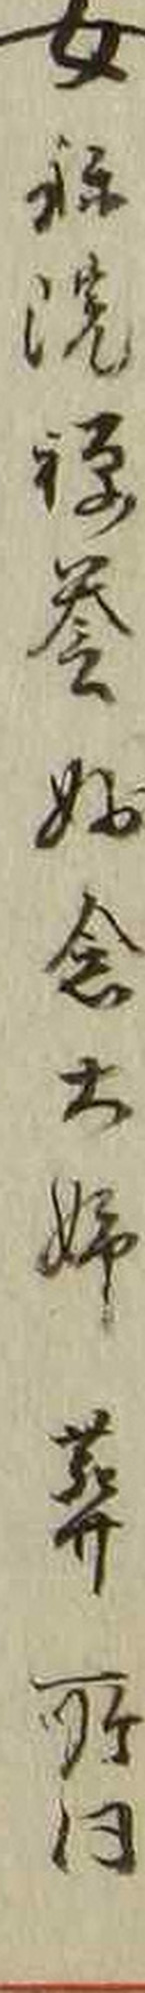称洗禅誉妙念大姉葬所同
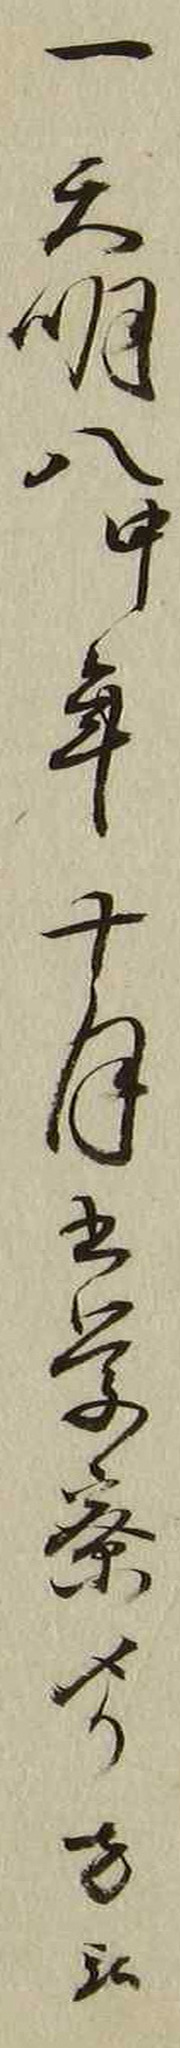一天明八申年十月書学寮〆り方被
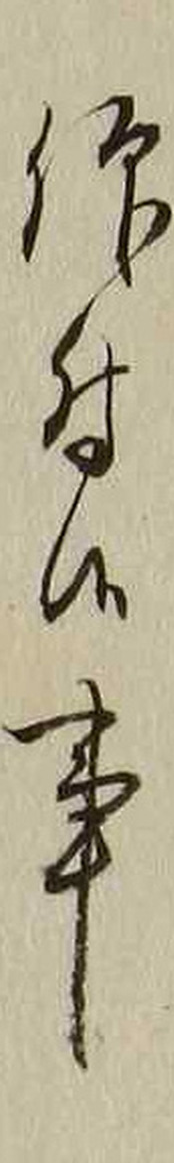仰付候事
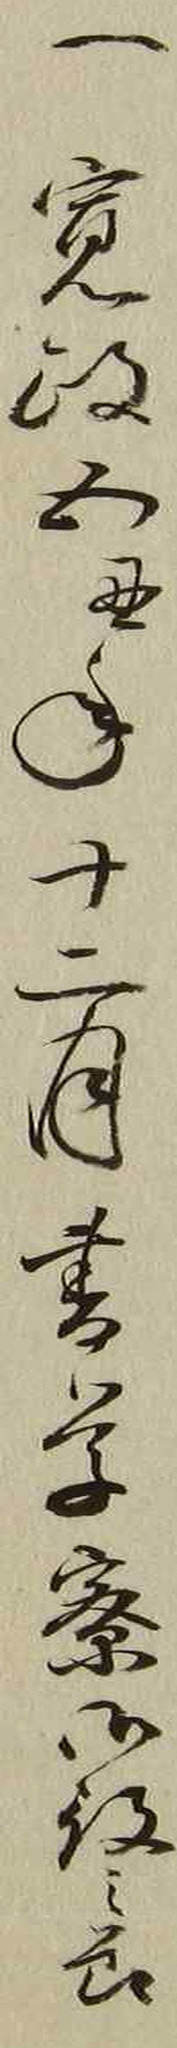一寛政五丑年十二月書学寮御役之節
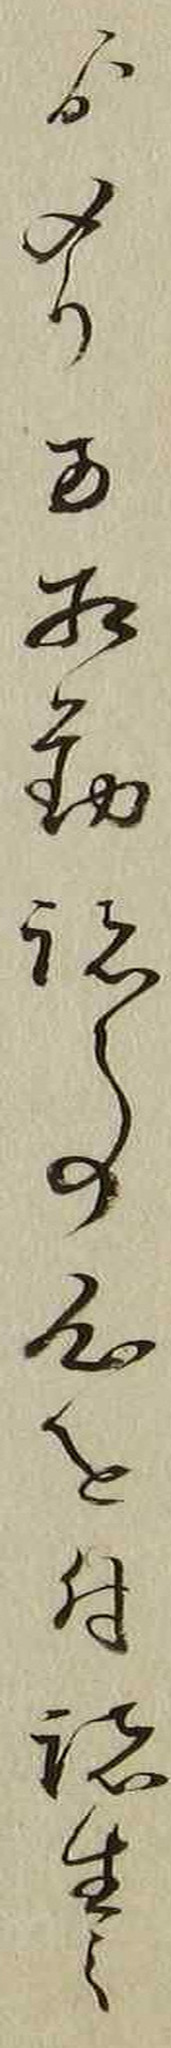ゟ〆り方相勤諸事心を付諸生之
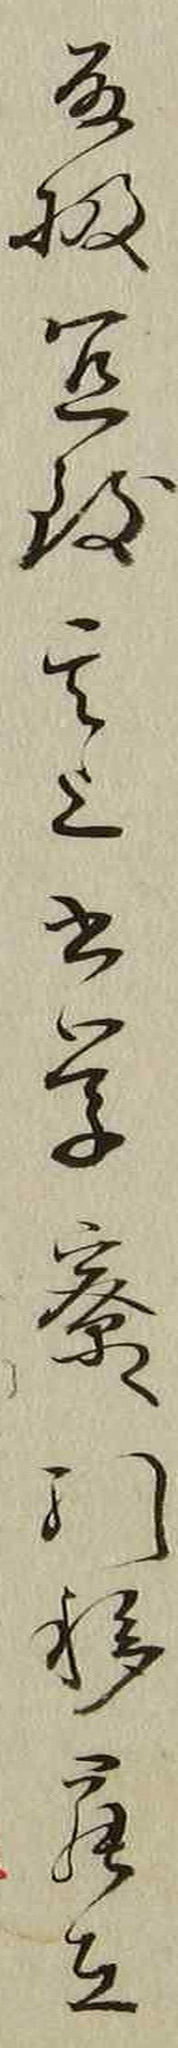取扱宜致其上書学寮へ引移罷在
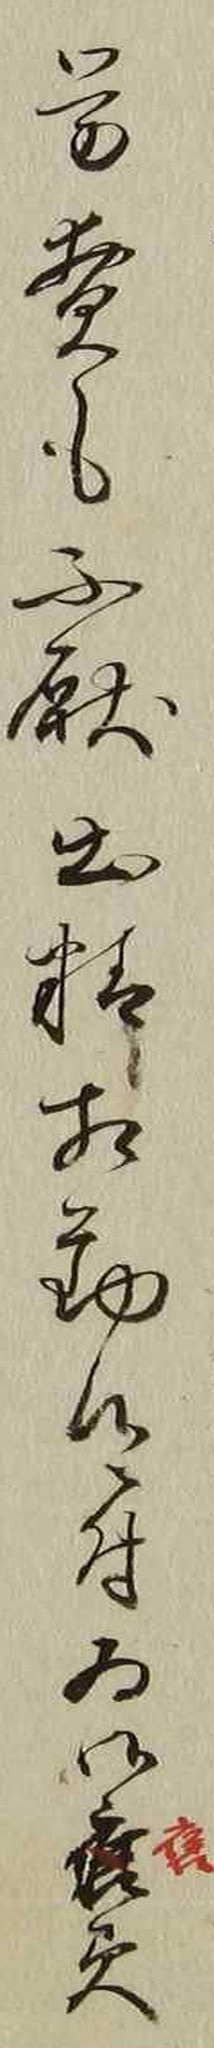労費も不厭出精相勤候ニ付為御褒美
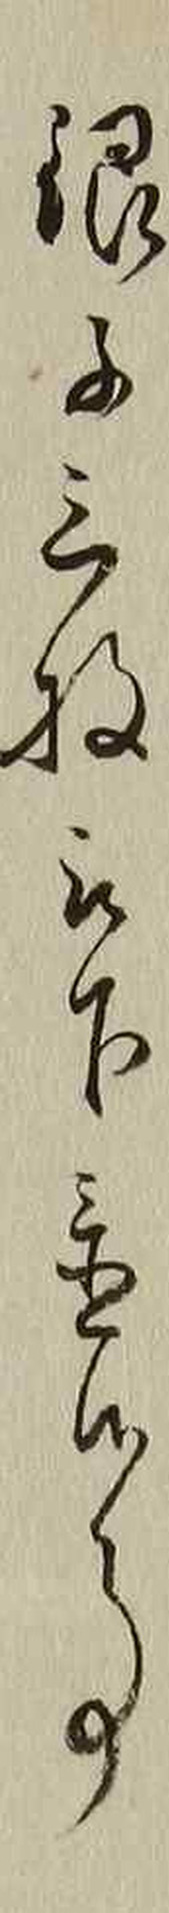銀子三枚被下置候事
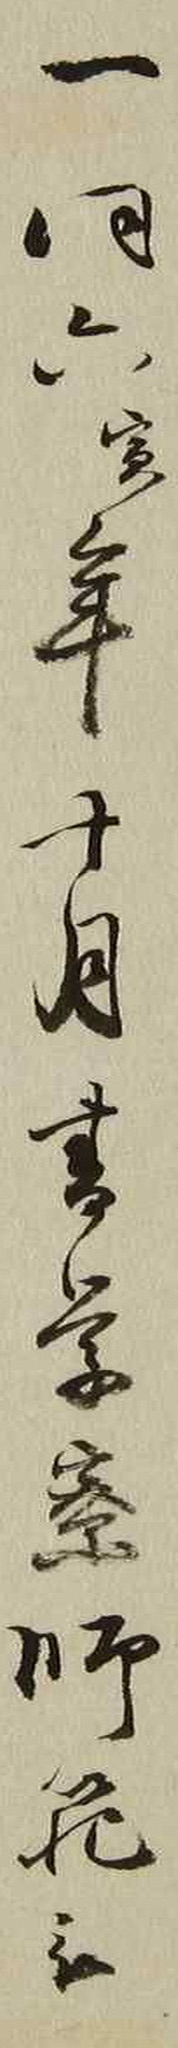一同六寅年十月書学寮師範被
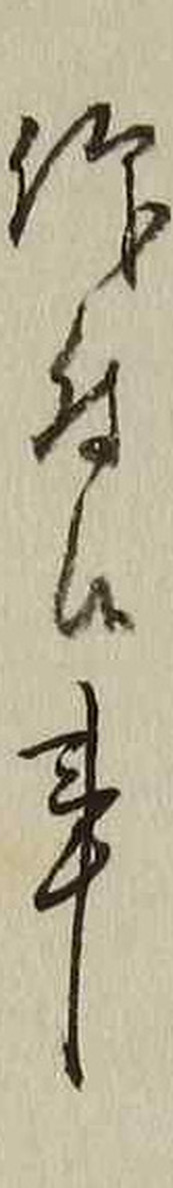仰付候事
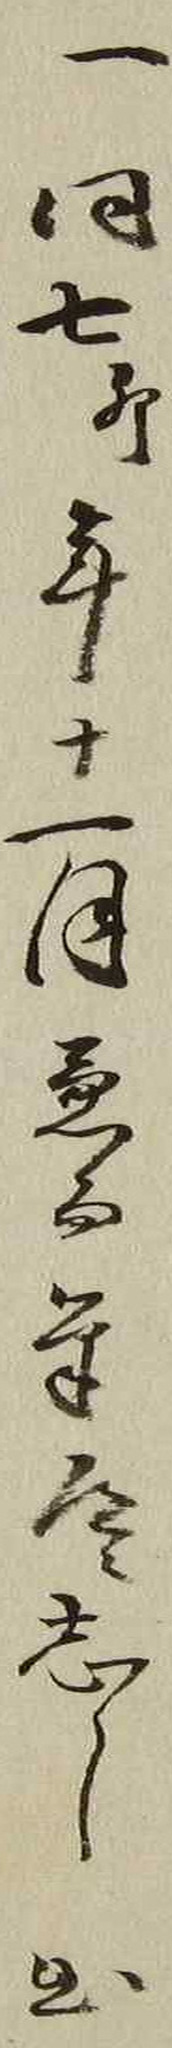一同七卯年十一月兼而筆道ニ志し出
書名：諸士系譜　巻之4　い之部4
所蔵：会津若松市立会津図書館
